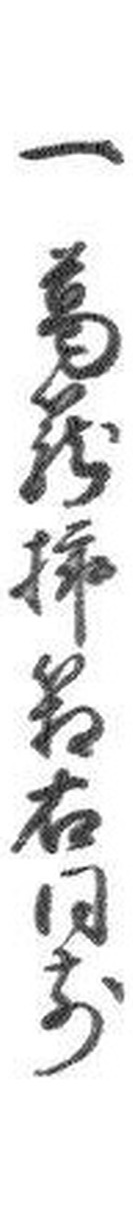一葛籠挿箱右同前
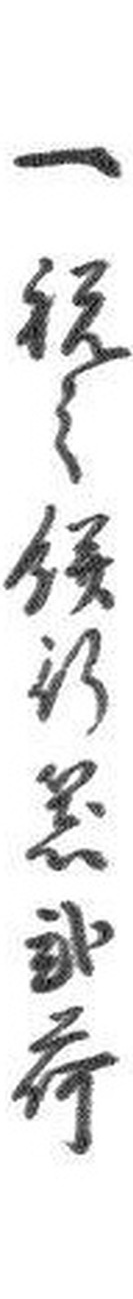一祝之餅行器弐荷
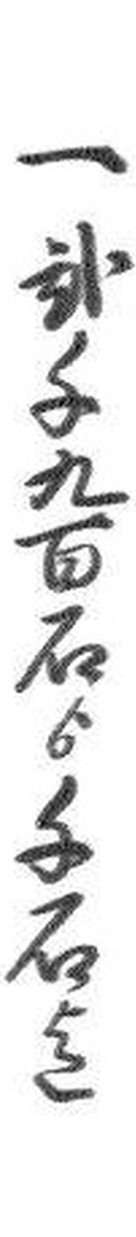一弐千九百石ゟ千石迄
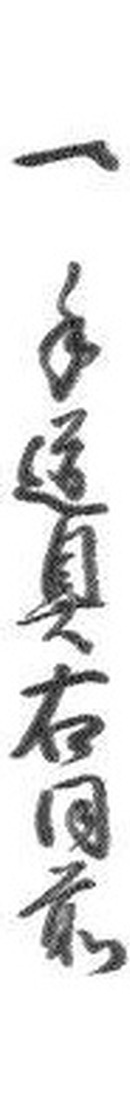一手道具右同前
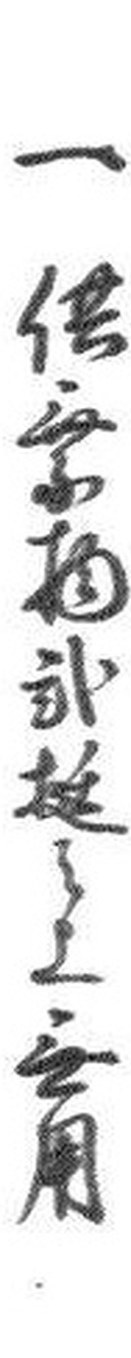一供乗物弐挺之上無用
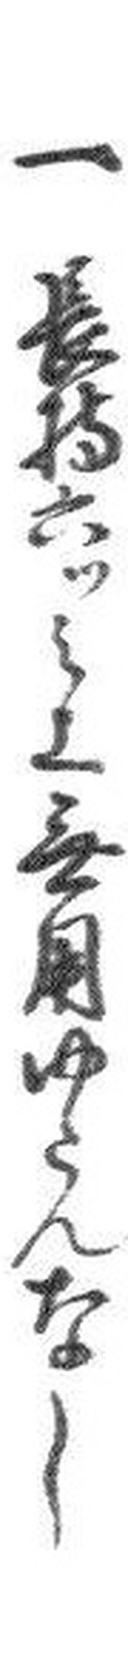一長持六ツ之上無用ゆたんなし
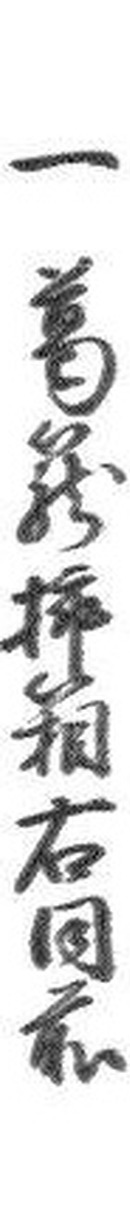一葛籠挿箱右同前

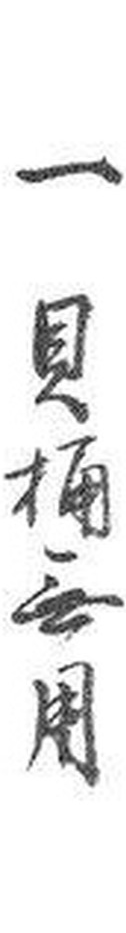一貝桶無用
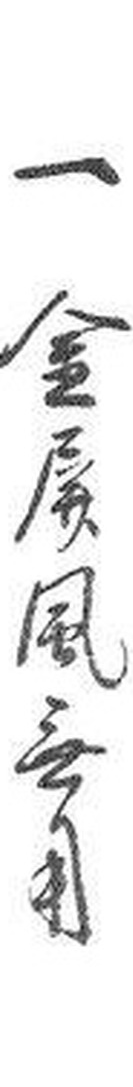一金屛風無用
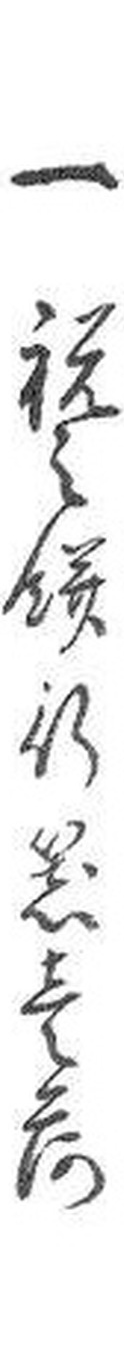一祝之餅行器壱荷
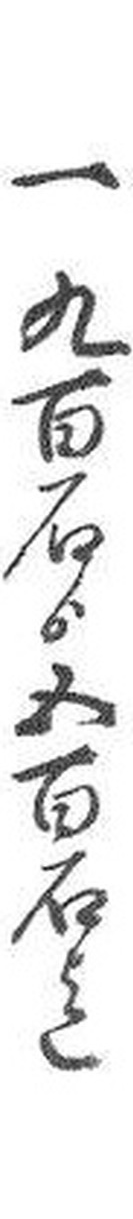一九百石ゟ五百石迄
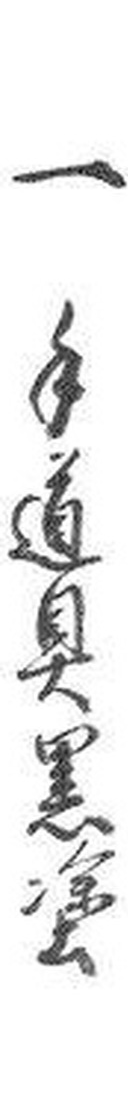一手道具黒塗
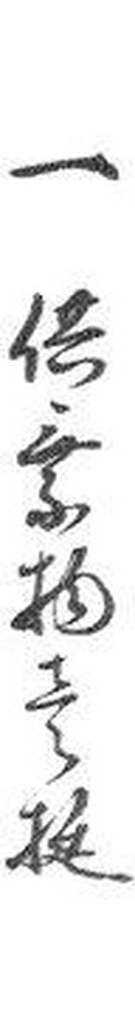一供乗物壱挺
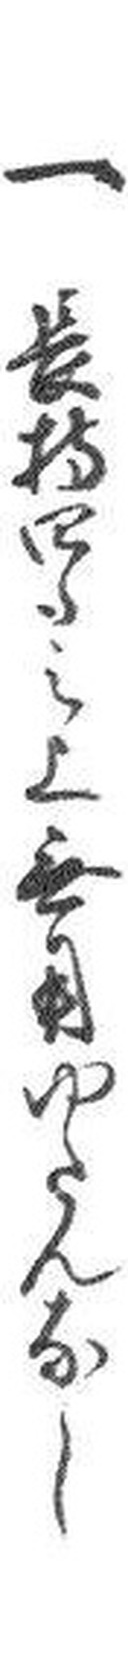一長持四ツ之上無用ゆたんなし
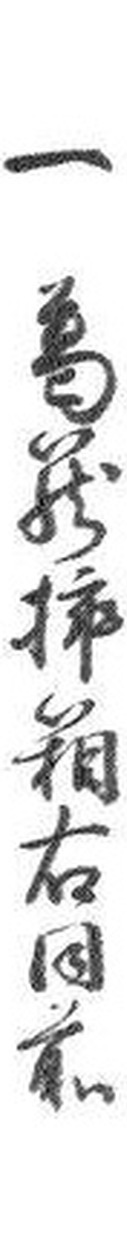一葛籠挿箱右同前
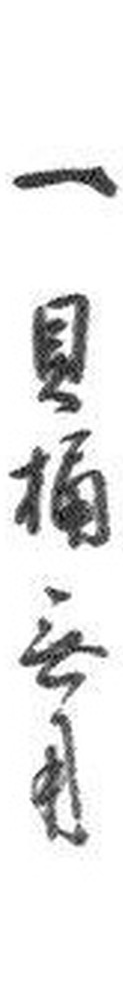一貝桶無用
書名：家譜 六 光通公 従万治三年到寛文三年
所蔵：福井県文書館 Fukui Prefectural Archives
